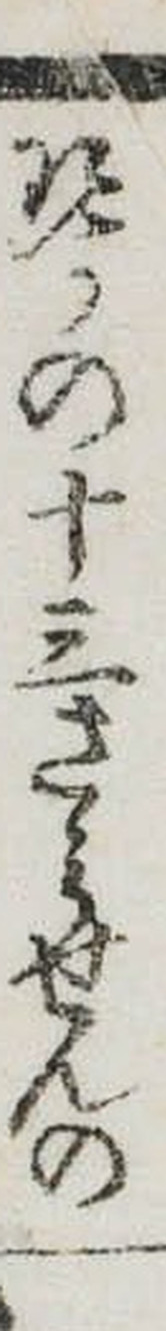琴の十三さみせんの
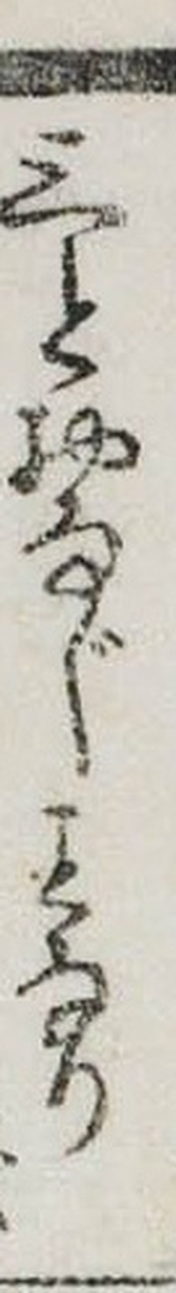三とおなじことなり
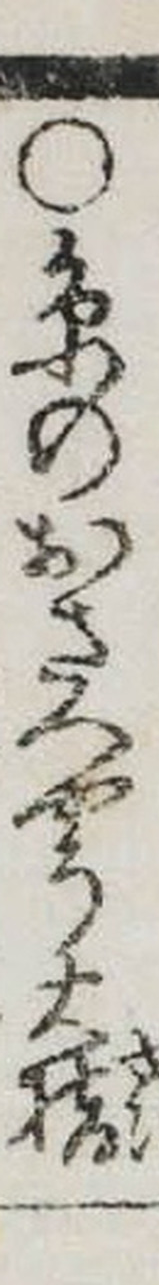○糸のおさへやう大指
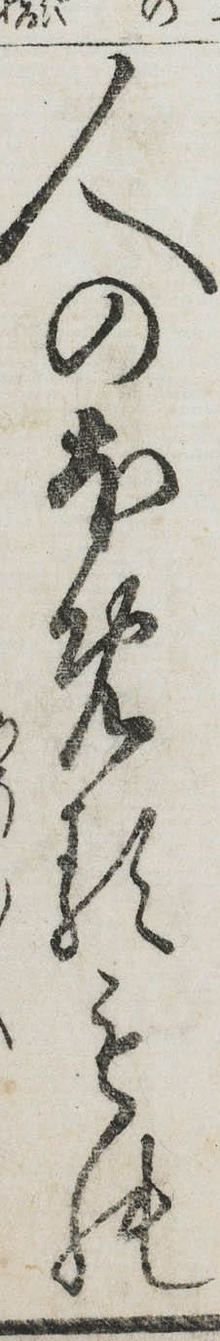人のほめるもの
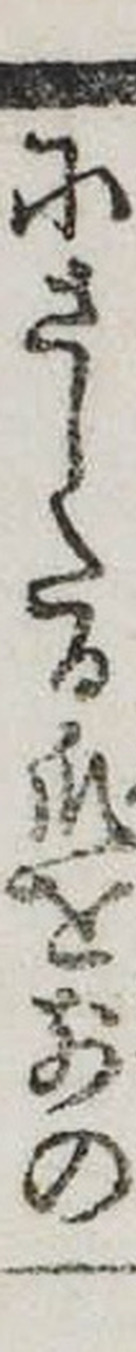にさしたる爪を前の
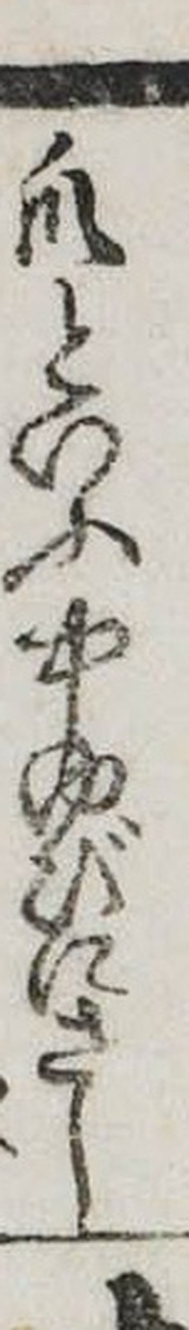爪といふ中ゆびにさし
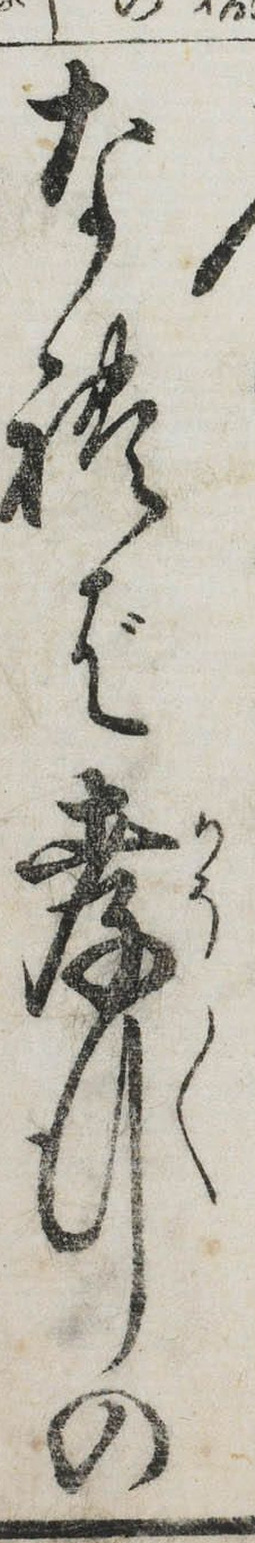なれば孝行の
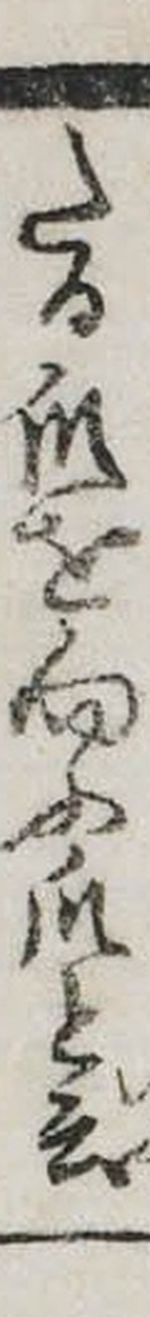たる爪を向ふ爪と云
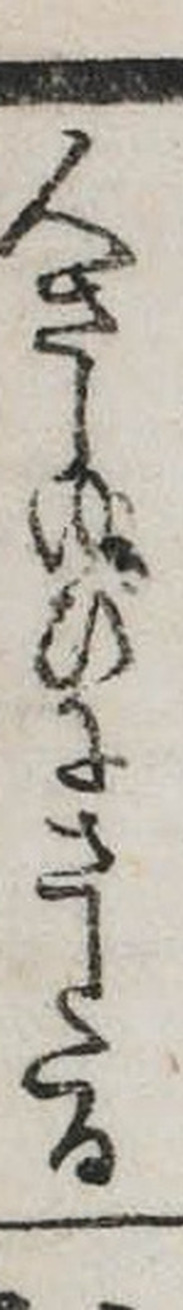人さしゆびにさしたる
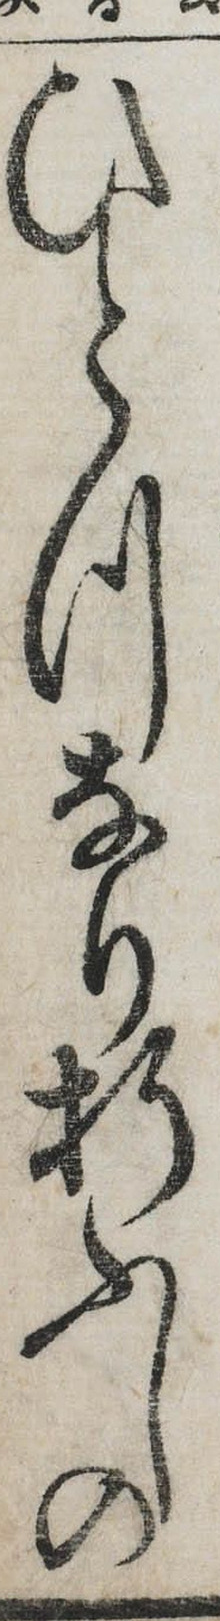ひとつなり折ふしの
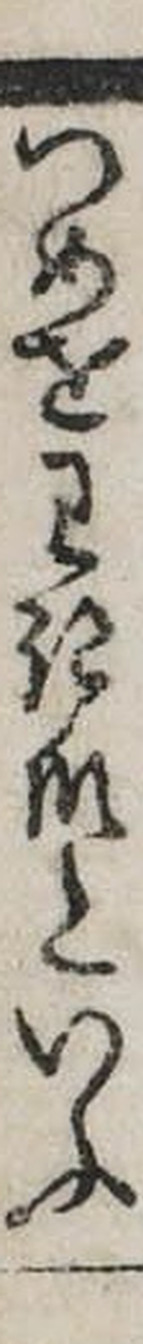つめをわき爪といふ

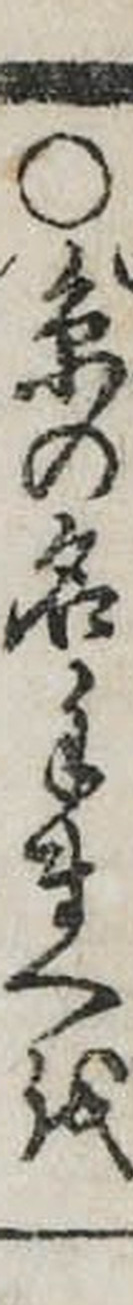○糸の名手まへを
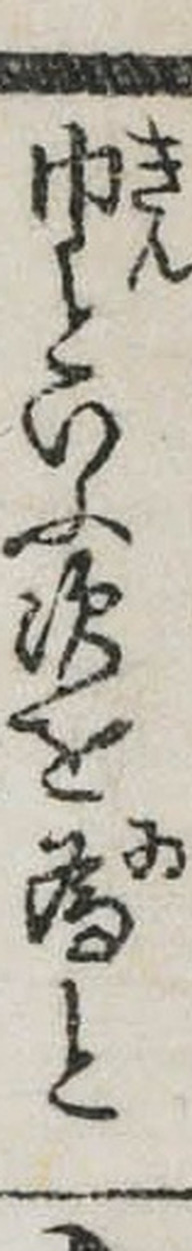巾といふ次を為と
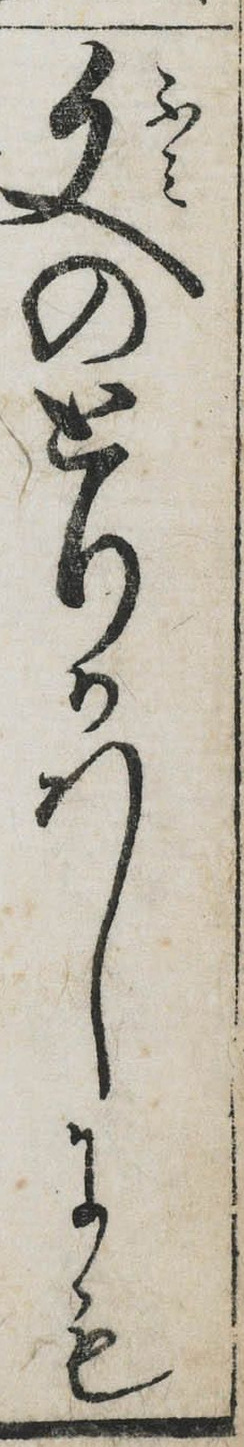文のとりかはしにも
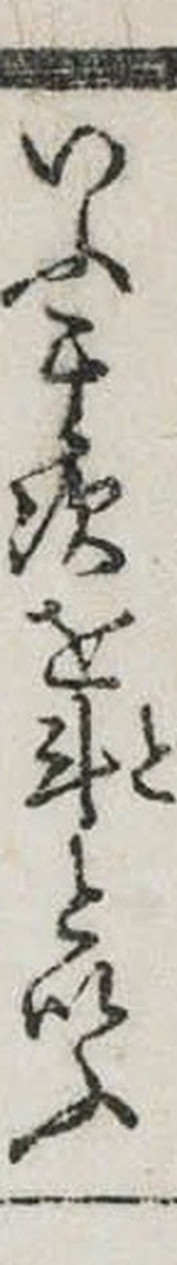いふ其次を斗といふ
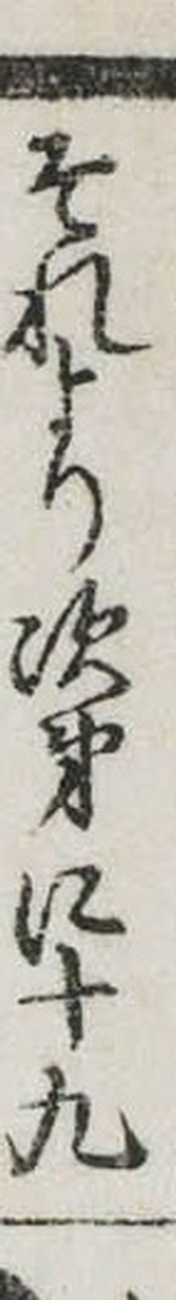それより次第に十九
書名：頭書萬用婦人手紙之文言
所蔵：東京学芸大学教育コンテンツアーカイブ
